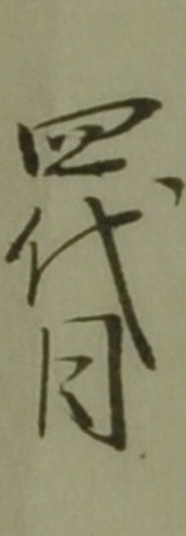四代目
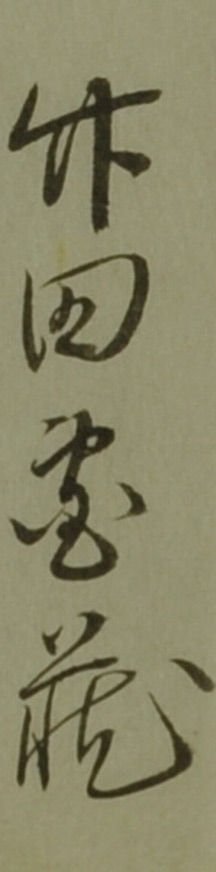竹田団蔵
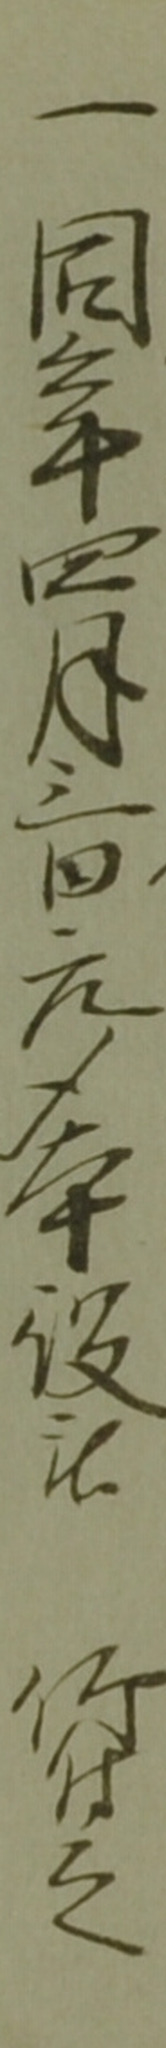一同年四月三日元〆本役被仰付之
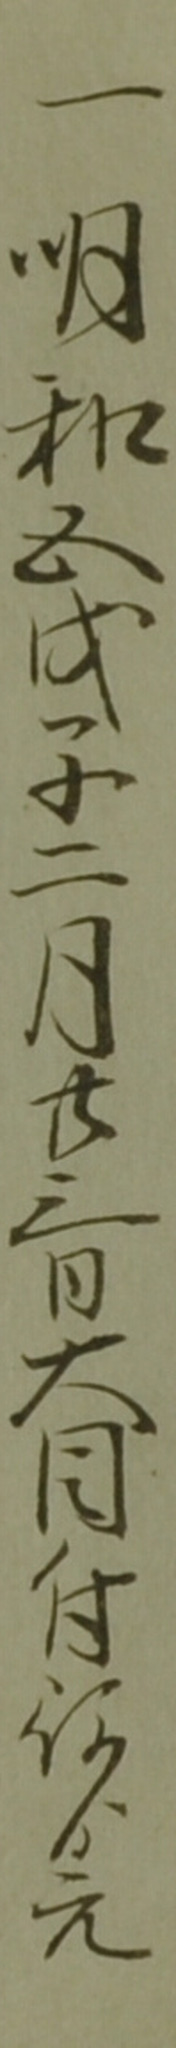一明和五戊子二月廿三日大目付役ゟ元
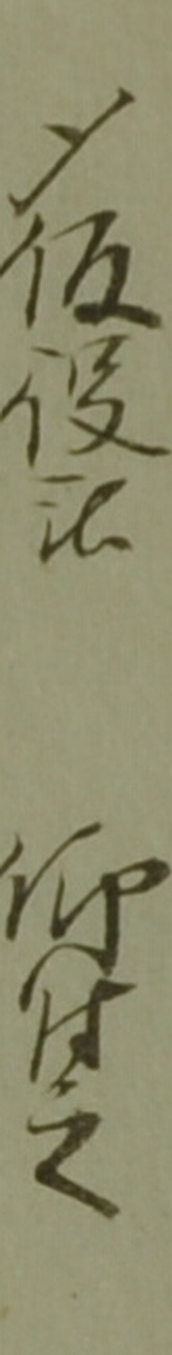〆仮役被仰付之
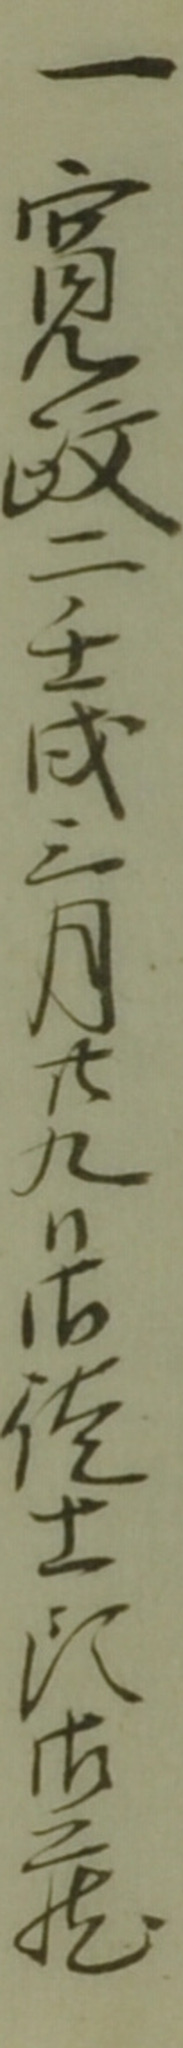一寛政二壬戌三月廿九日御徒士頭御蔵
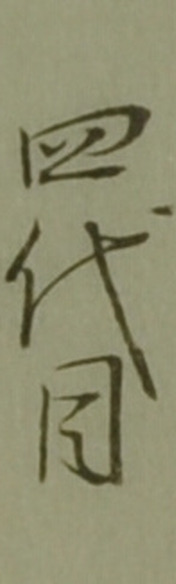四代目
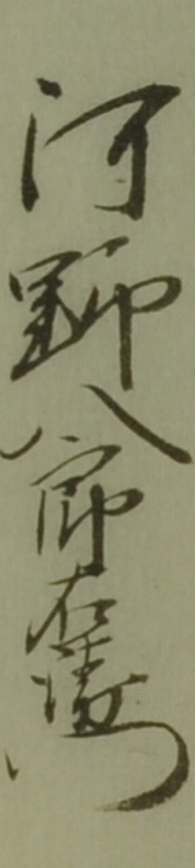河野八郎右衛門
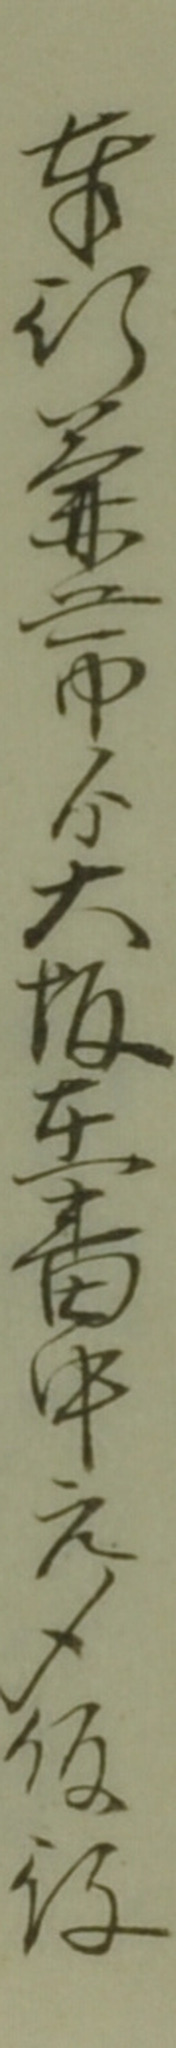奉行兼帯ゟ大坂在番中元〆仮役
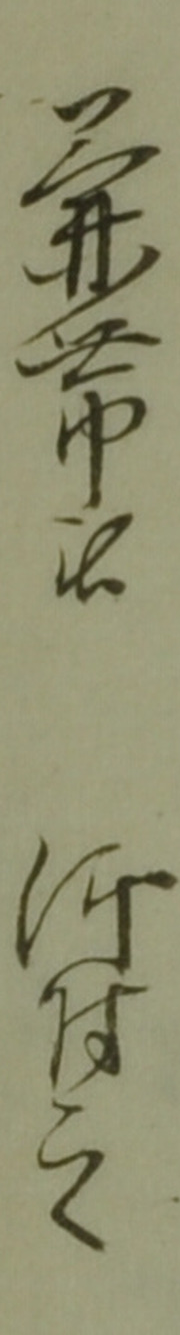兼帯被仰付之

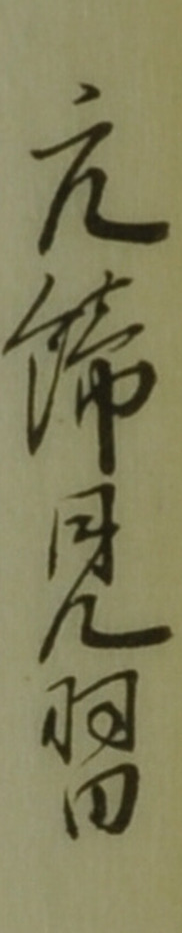元締見習
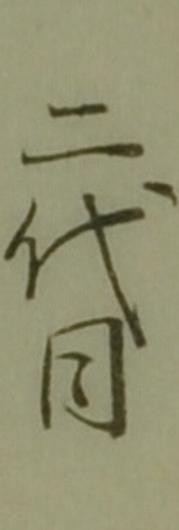二代目
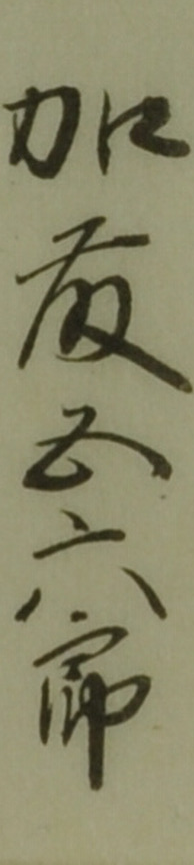加藤五六郎
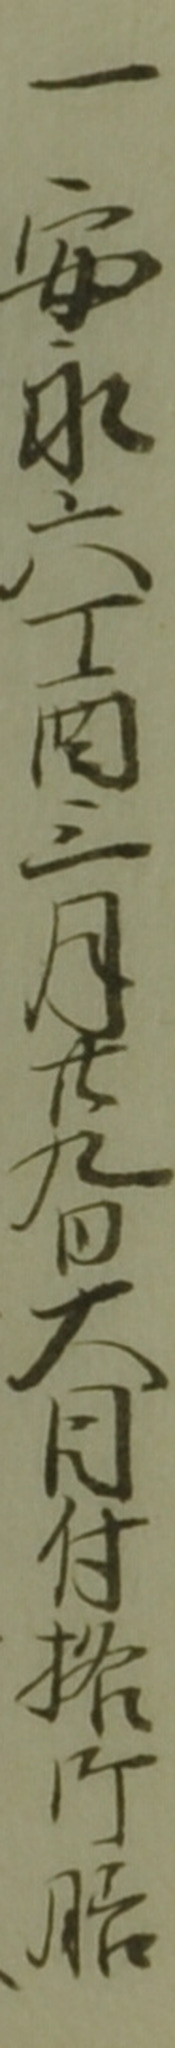一安永六丁酉三月廿九日大目付格御膳
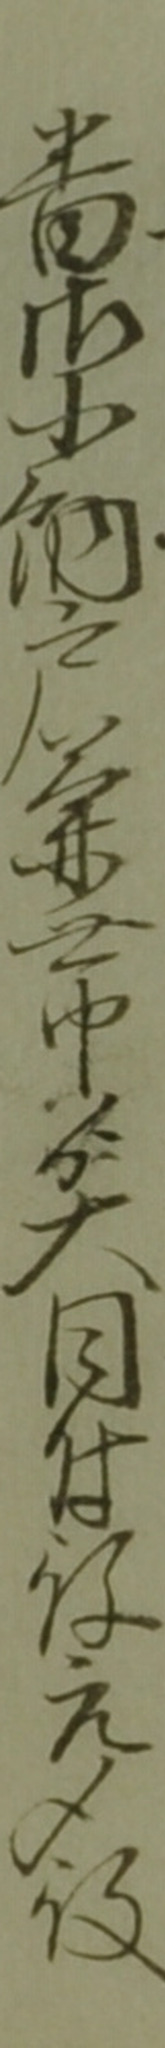番御小納戸兼帯ゟ大目付役元〆役
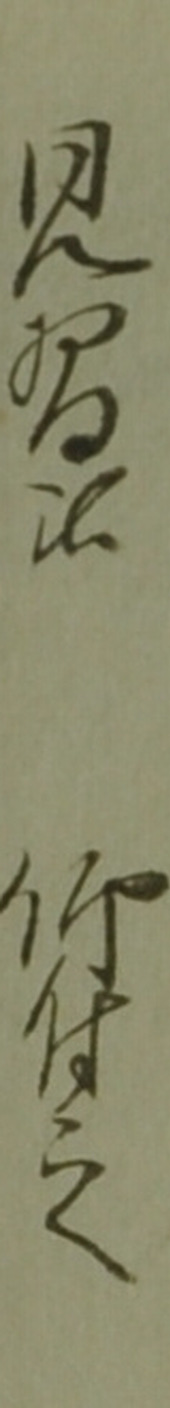見習被仰付之
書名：諸御役代々録（七）
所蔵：伊那市立高遠町図書館・合同会社AMANE
